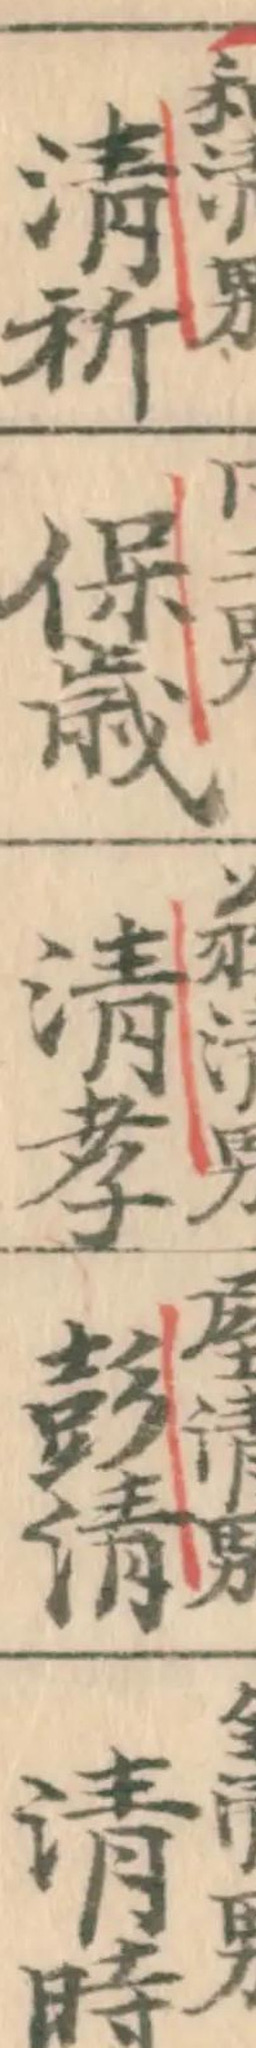清祈保歳清孝彭清清時
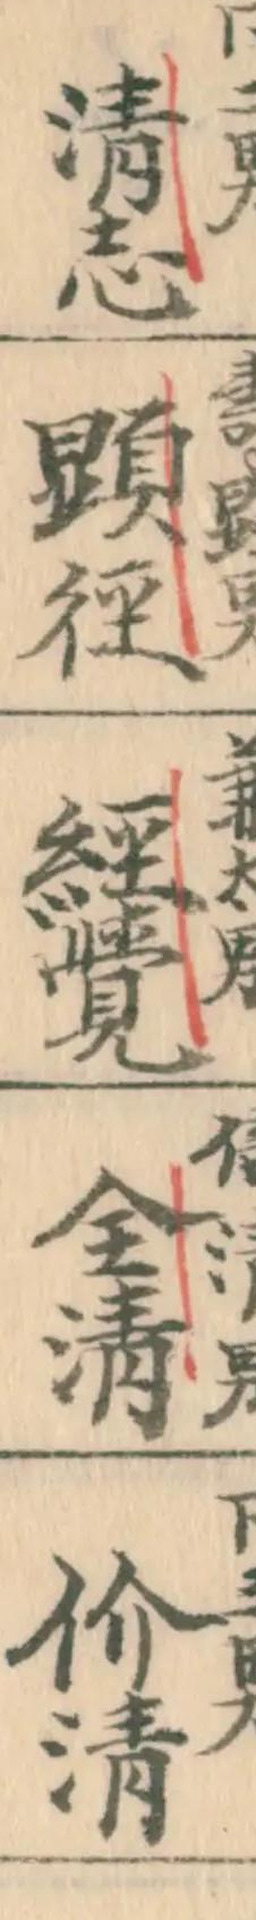清志顕径経覚全清价清
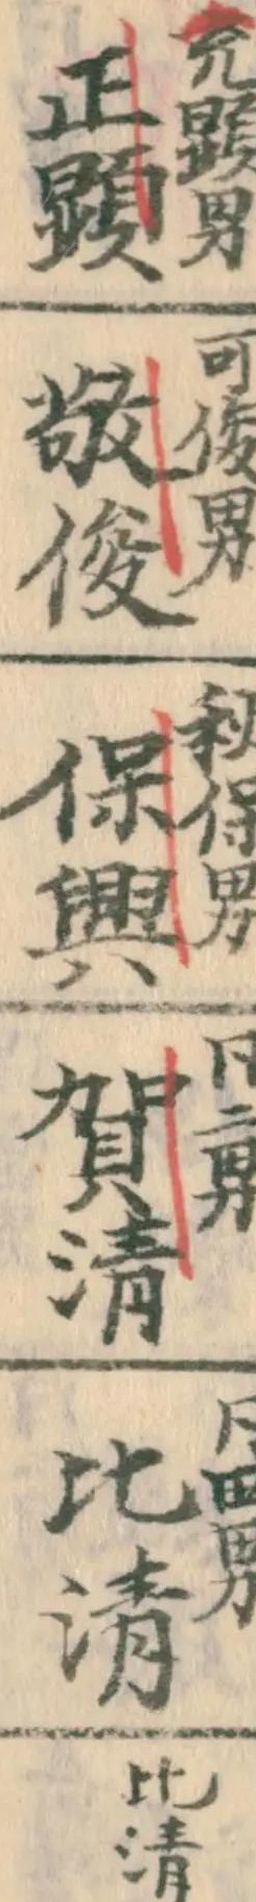正顕敬俊保興賀清比清
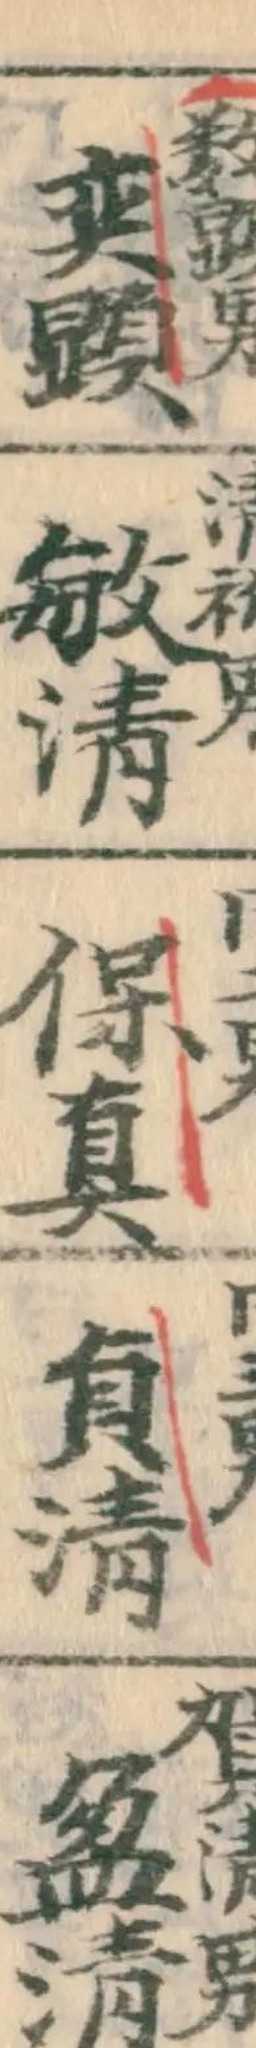奕顕敏清保真貞清盈清
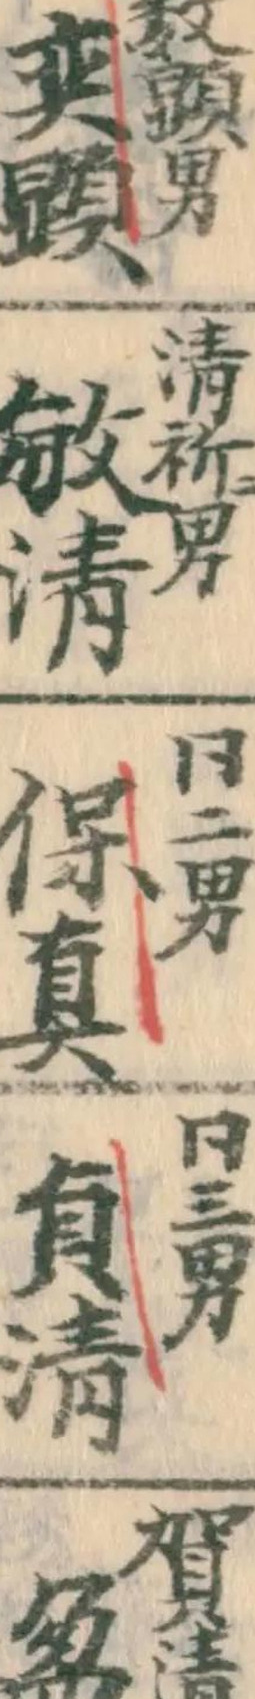奕顕敏清保真貞清盈清
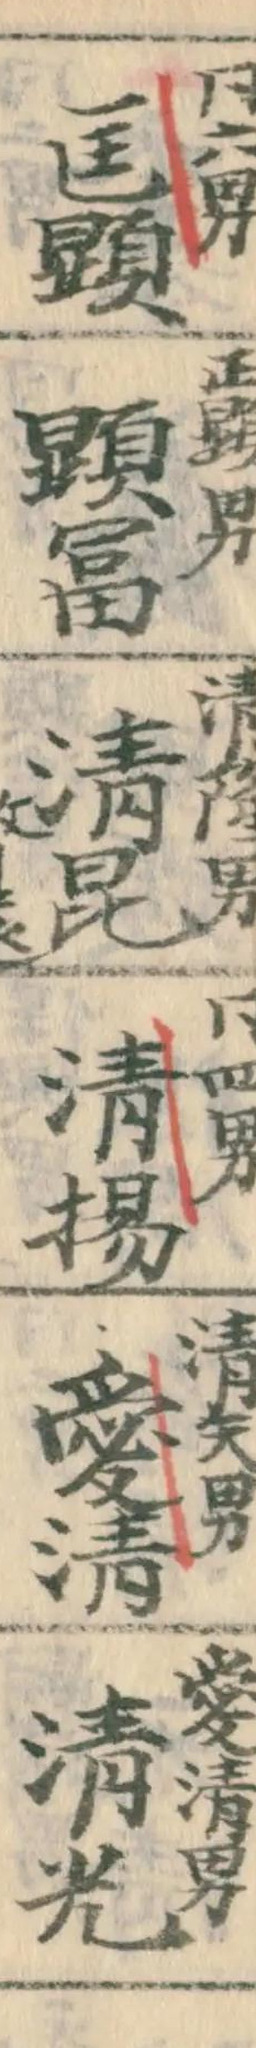匡顕顕冨清昆清揚愛清清光
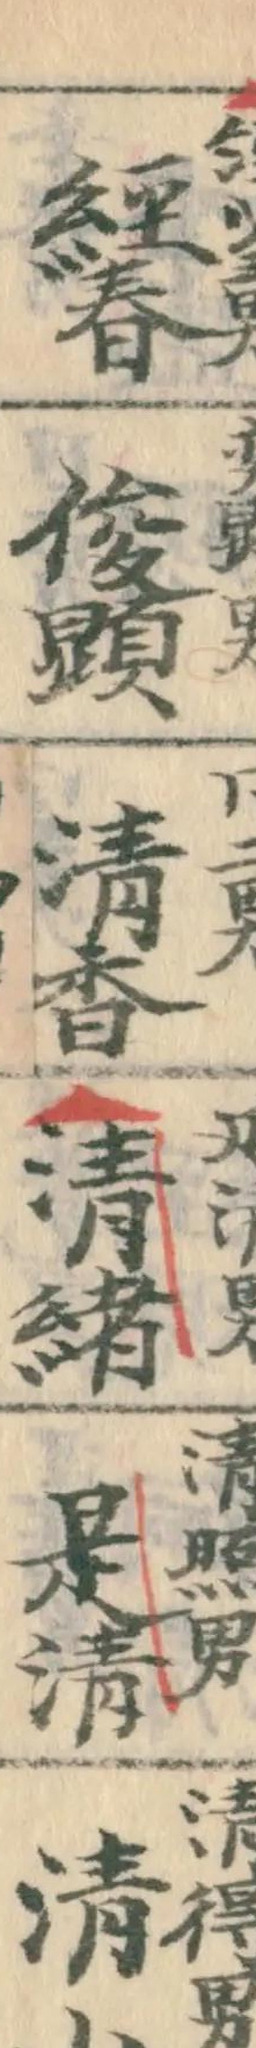経春俊顕清香▲清緒是清清山

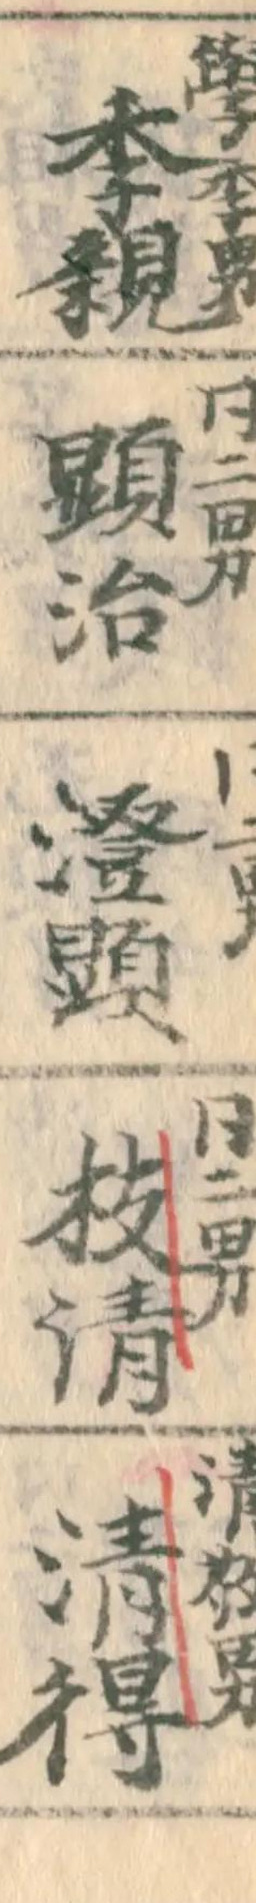季親顕治澄顕枝清清得
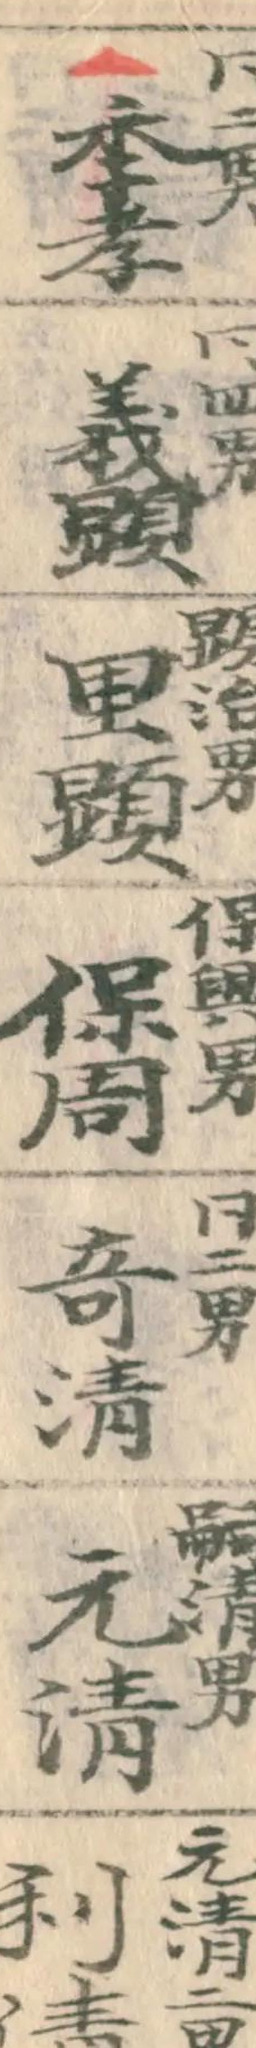▲季孝義顕里顕保周奇清元清利清
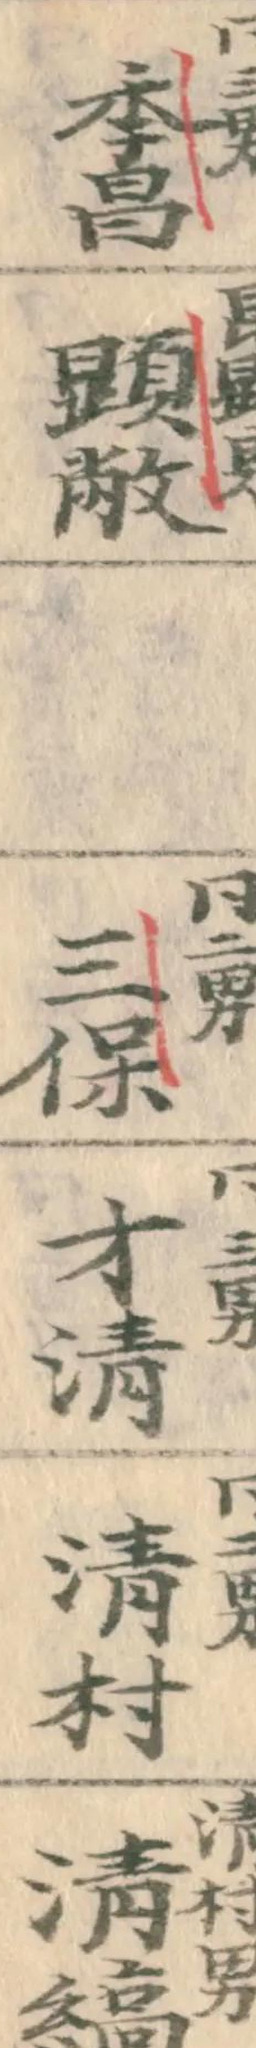季昌顕敞三保才清清村清縞
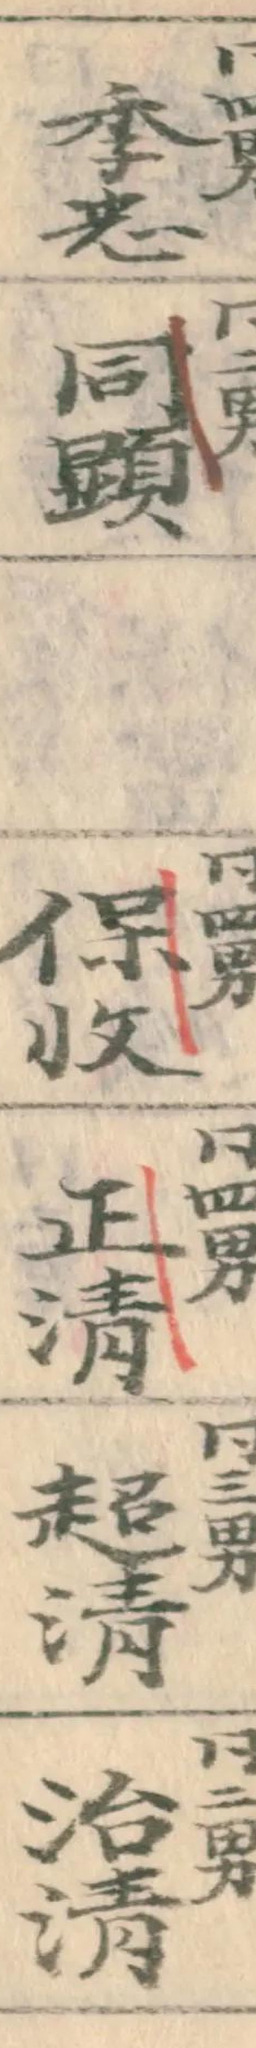季忠同顕保収正清超清治清
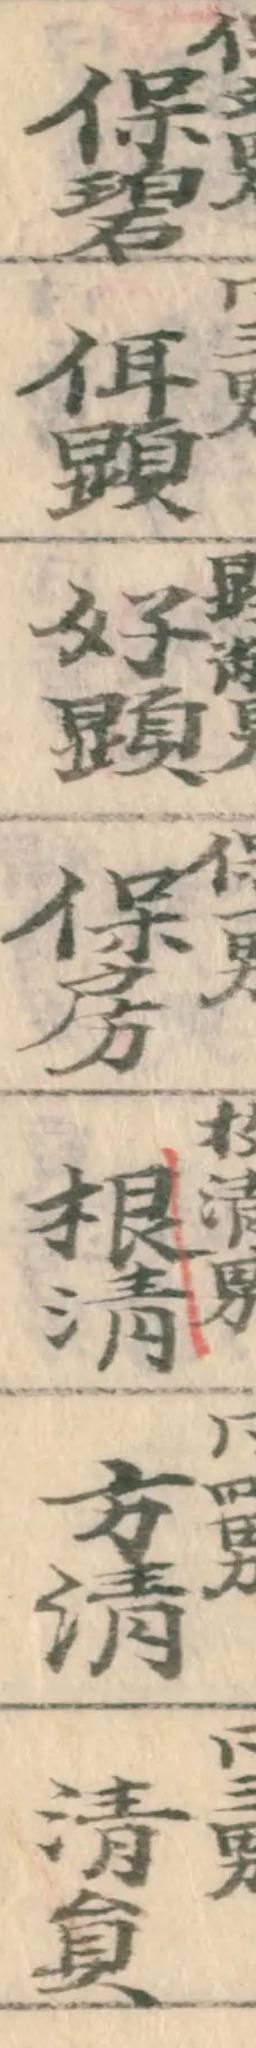保碧㑙顕好顕保房根清方清清員

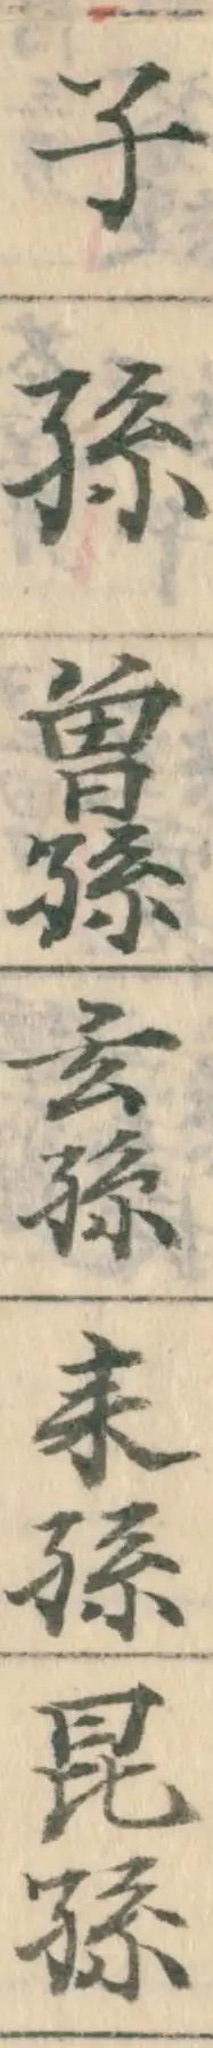子孫曽孫玄孫来孫昆孫
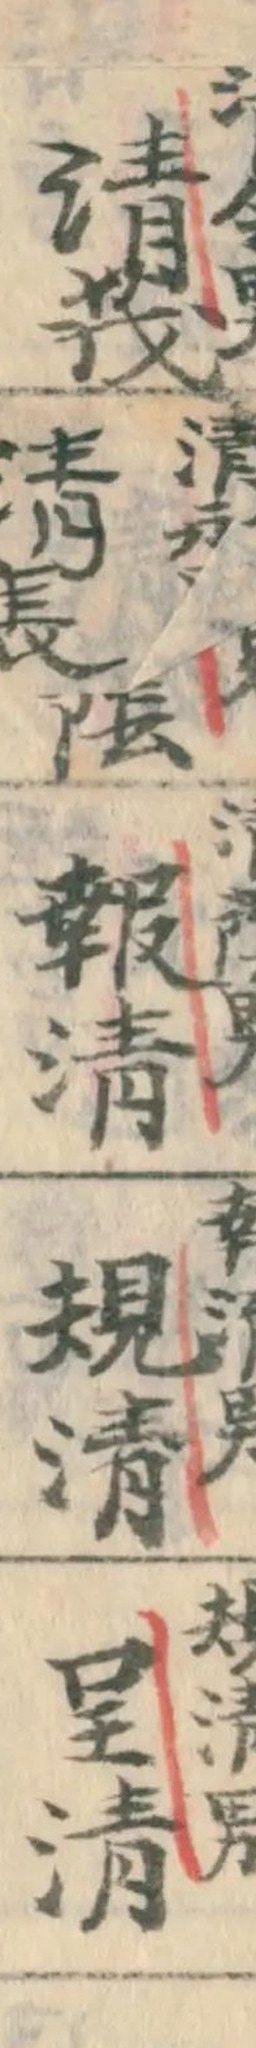清茂清長報清規清呈清
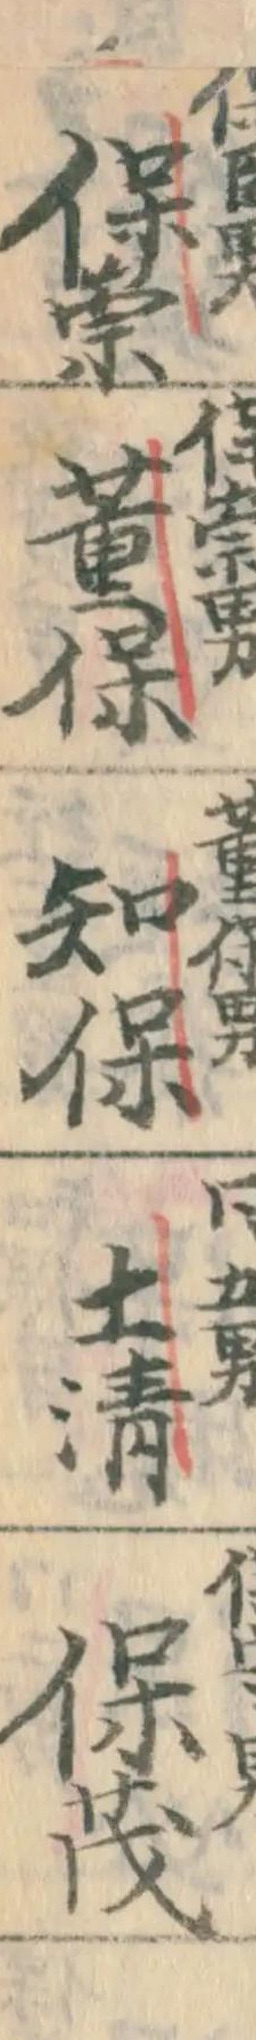保崇董保知保土清保茂
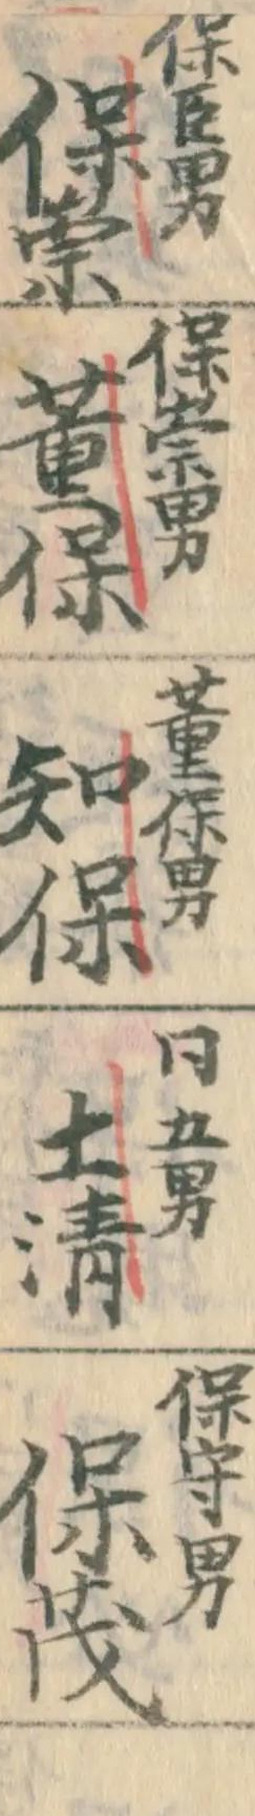保崇董保知保土清保茂
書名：賀茂社記録. 第24冊
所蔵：国立国会図書館 National Diet Library, JAPAN
